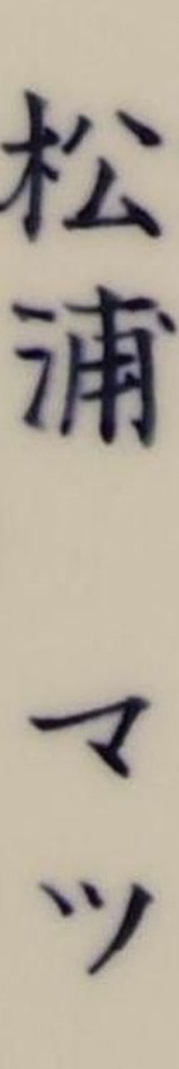松浦マツ
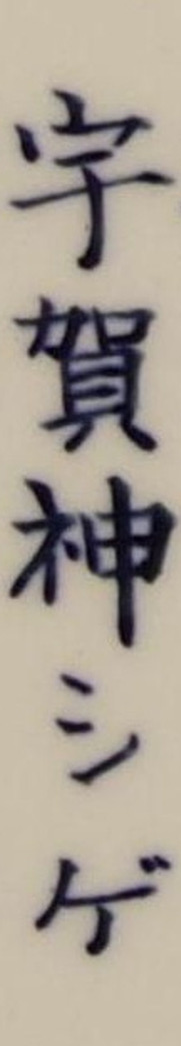宇賀神シゲ
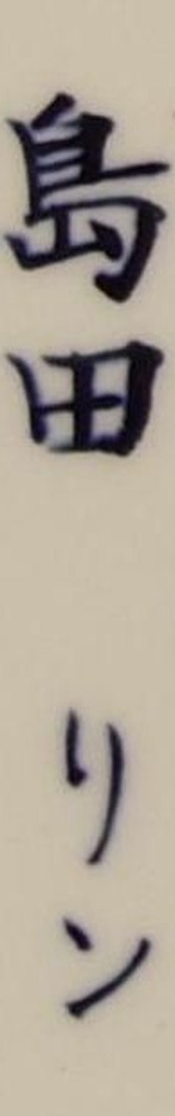島田リン
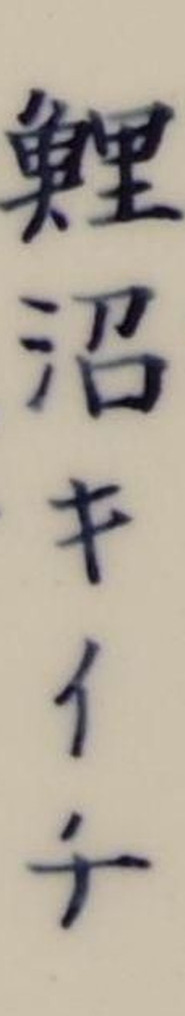鯉沼キイチ
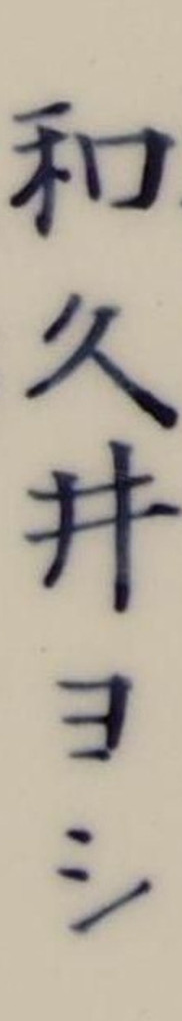和久井ヨシ
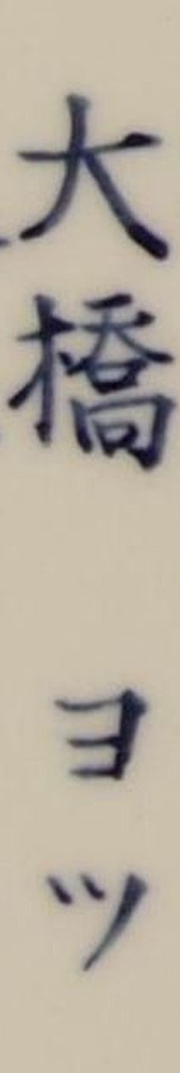大橋ヨツ
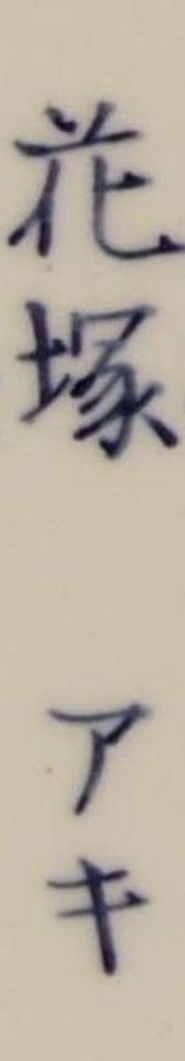花塚アキ
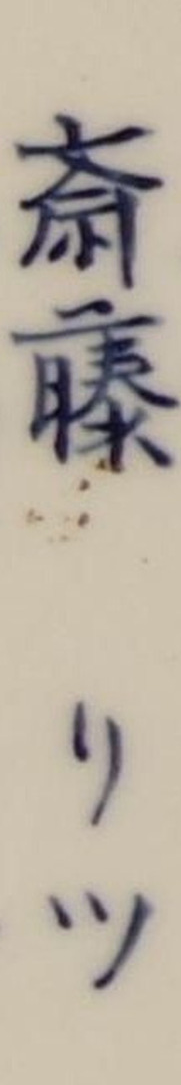斎藤リツ
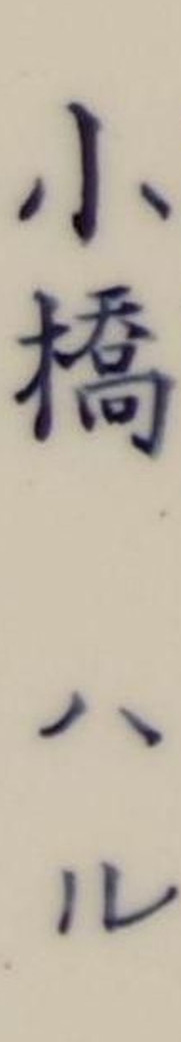小橋ハル
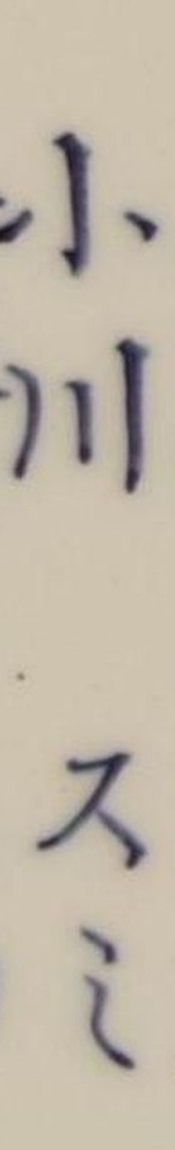小川スミ

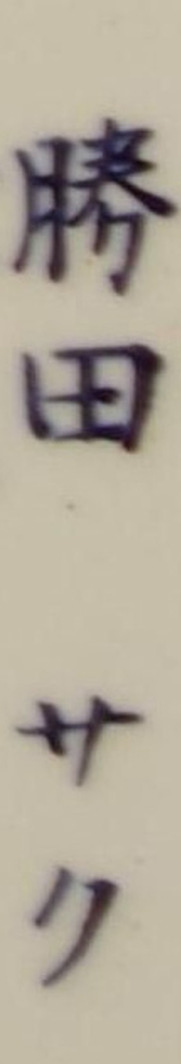勝田サク
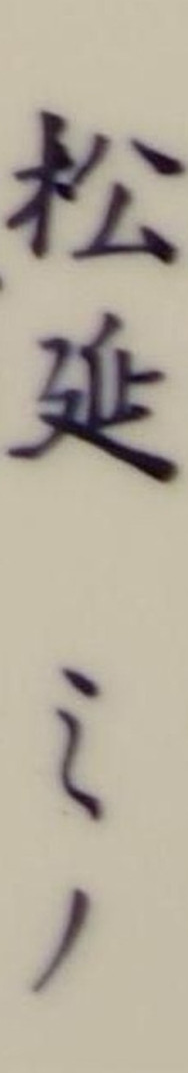松延ミノ
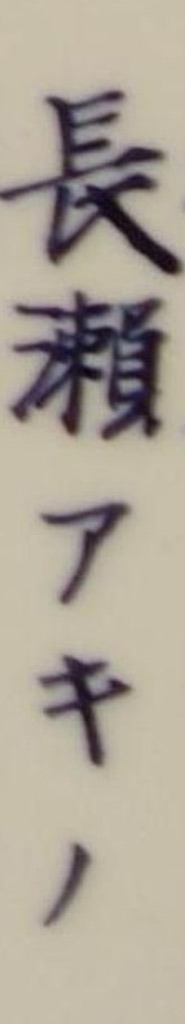長瀬アキノ
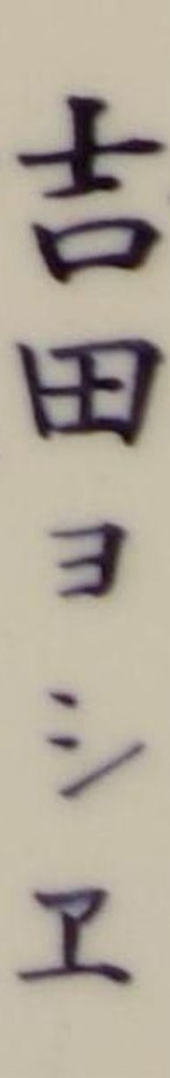吉田ヨシエ
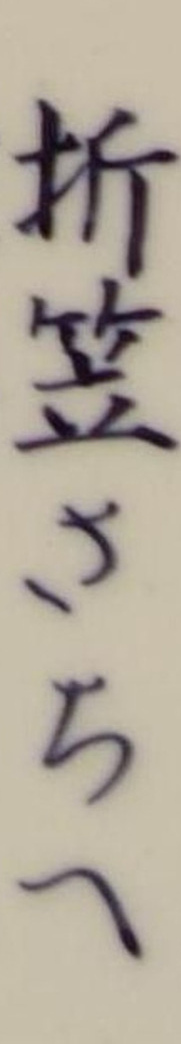折笠さちへ
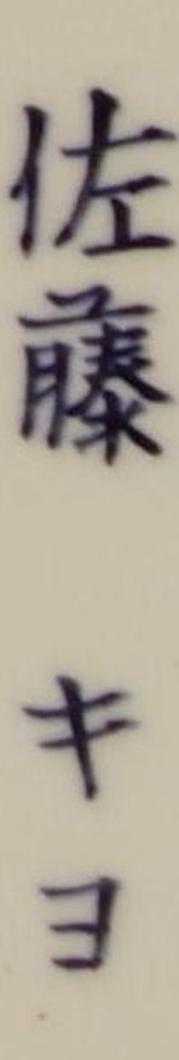佐藤キヨ
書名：M~S
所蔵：高野山金剛峯寺
